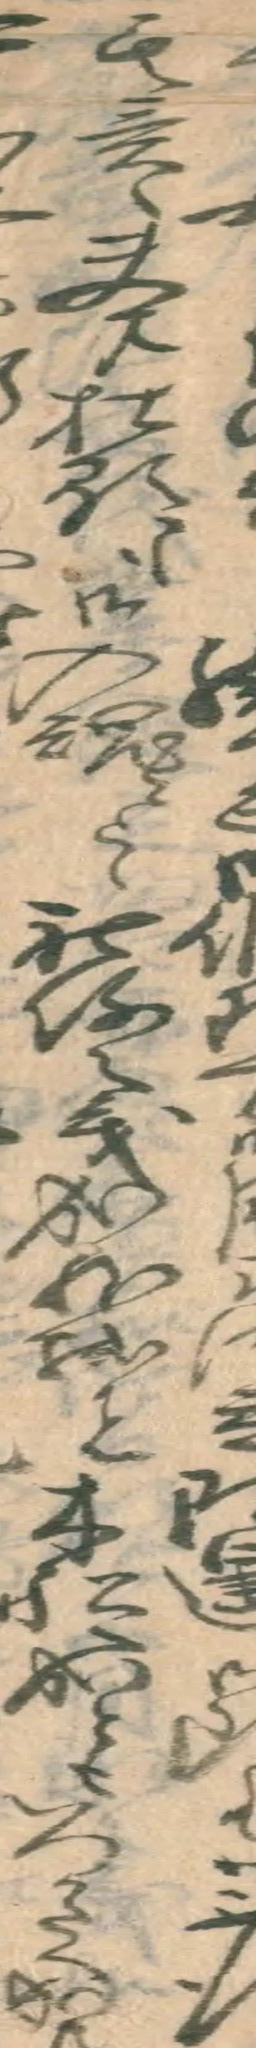其意候夫共杜顕ニも御入魂ニ候ハヽ社役之義成程拙者者木船へ成ともいつかたへ成共
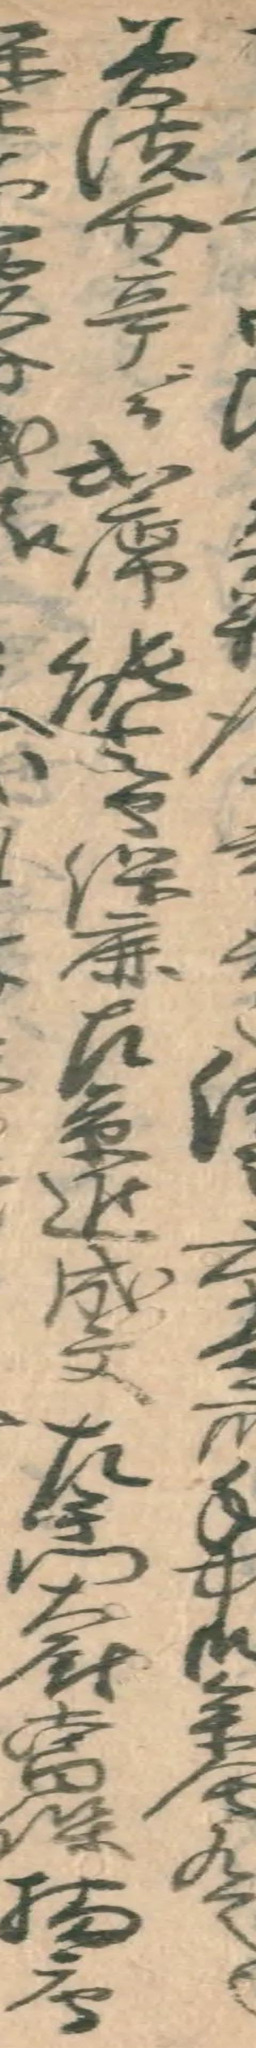美濃介亭ニ而出席能登守保鹿左京進成文左衛門大尉当保播磨守
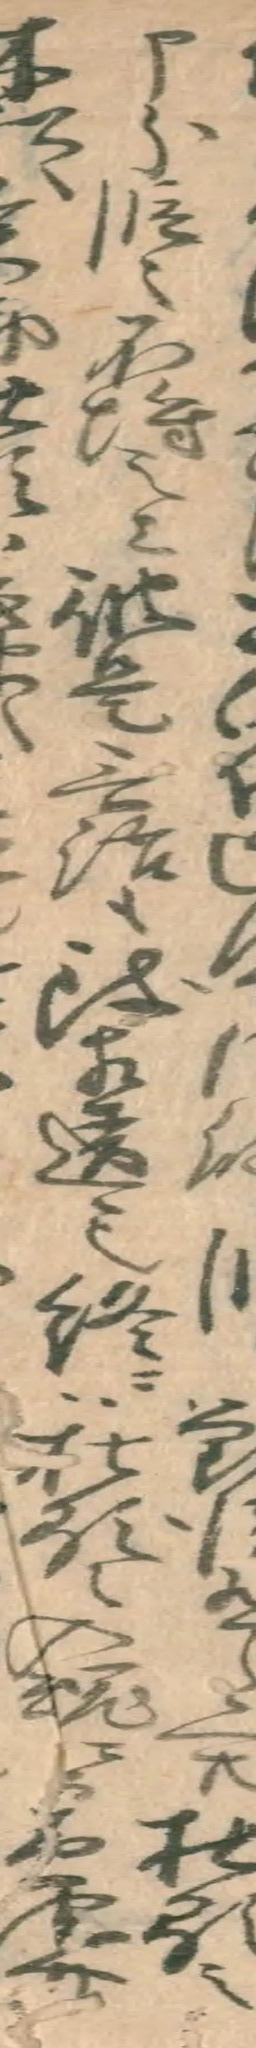申分段々不埒之上彼是言語も致相違候也終ニハ杜顕之入魂ニ而美濃介
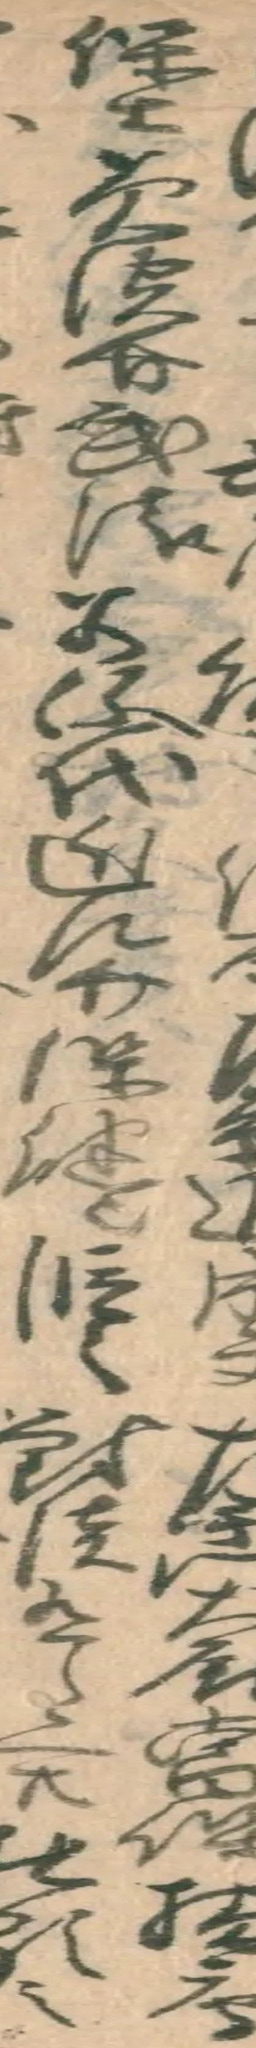保土美濃介武清若役代近江介保健也段々対談有之候へ共杜顕之
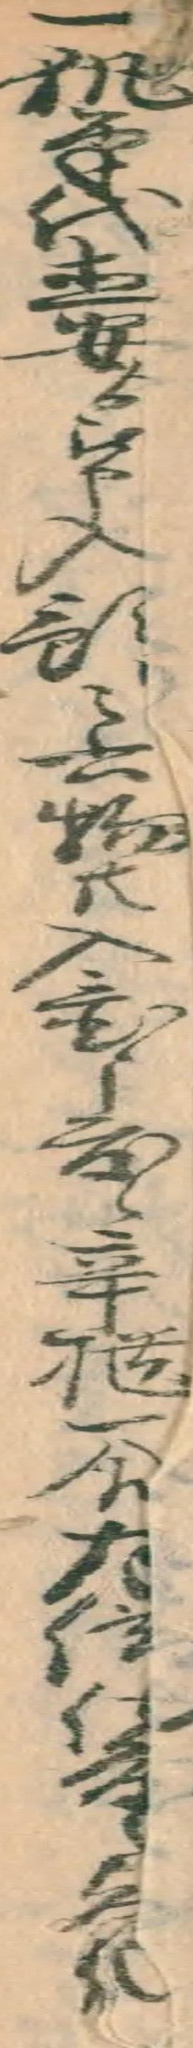一執筆代直安ゟ被申入預之書物共入置申度候辛櫃一合拝借仕度之旨也
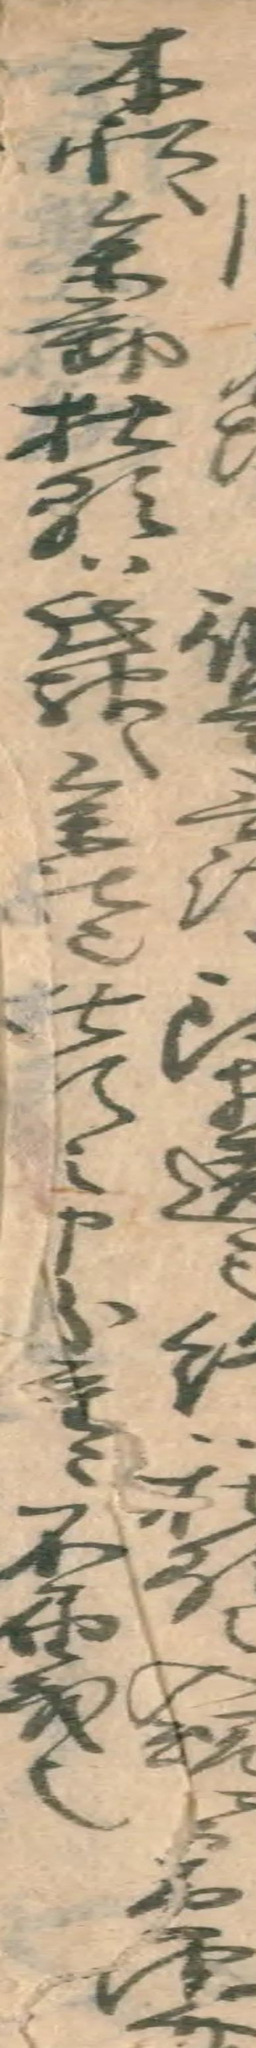木船へ参勤杜顕ハ氏神へ参社也他行之申分重々不届義也
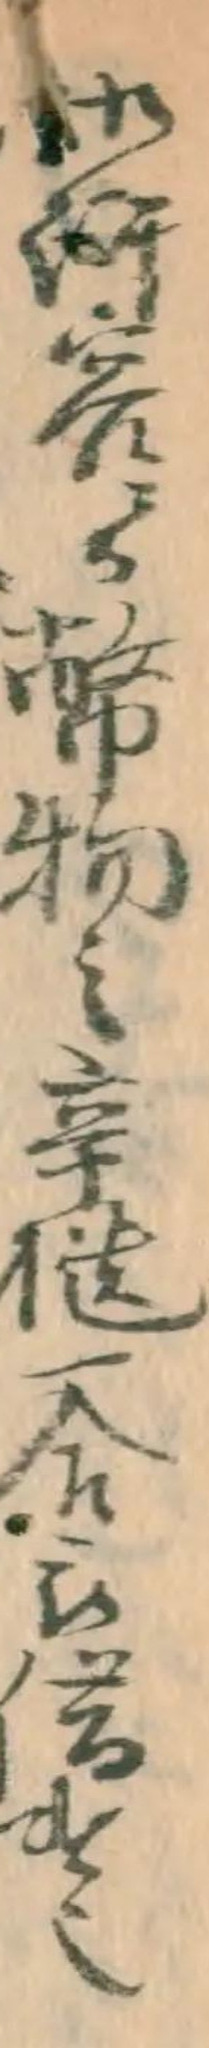御許容ニ而幣物之辛櫃一合被借遣也
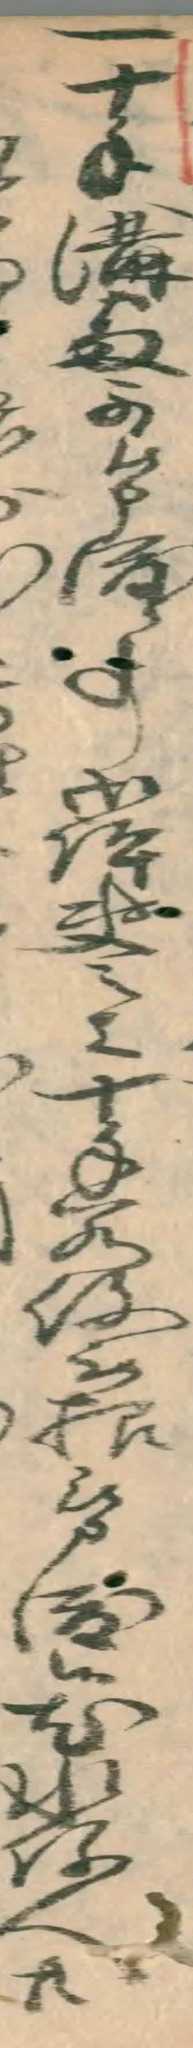一十手へ溝番可被申渡候事御評決之上十手若役被招被申渡候尤水役人共
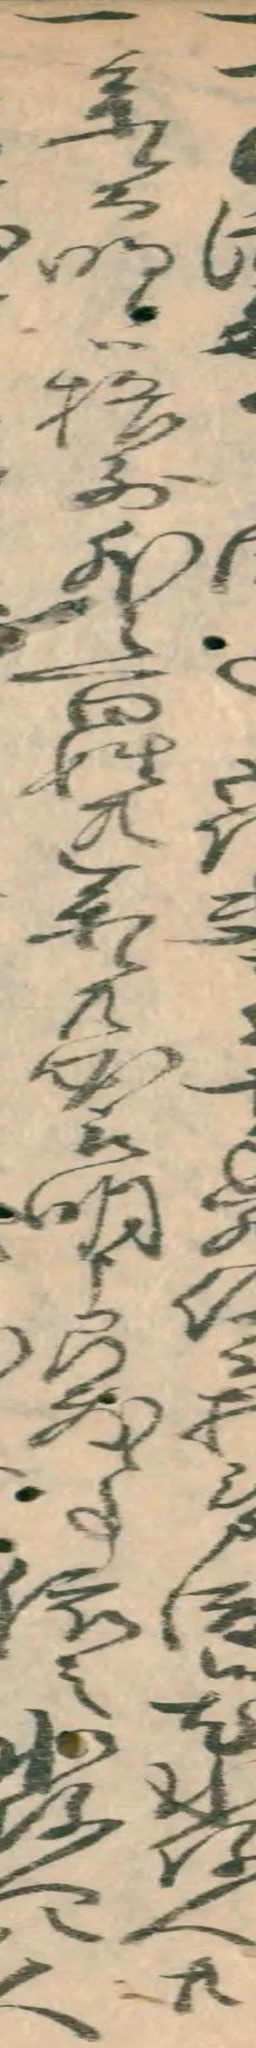一参候而明日ハ格別外之百姓共参候共必被明申間敷候事依之水役人八人
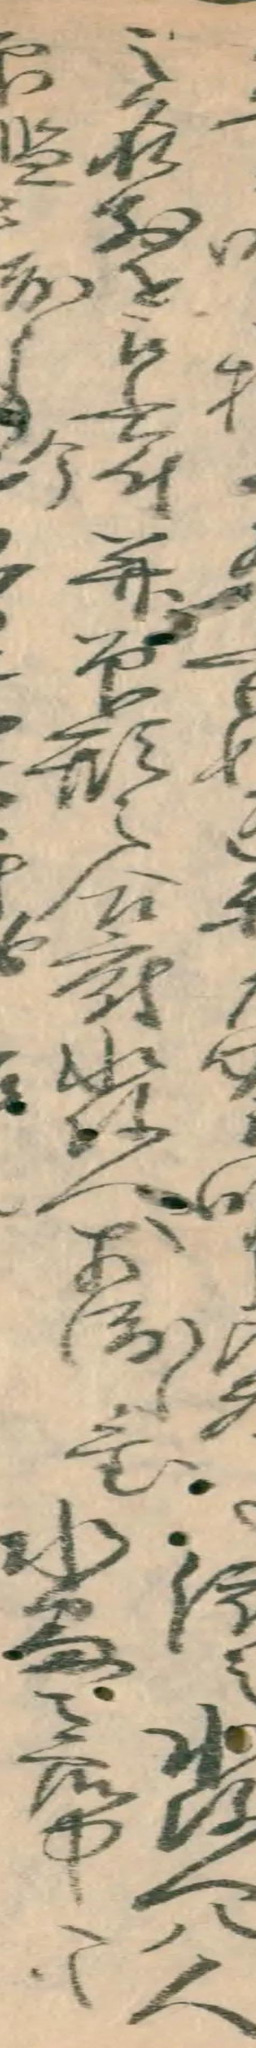之名前を被書付并印形之合府水役人へ相渡し置水番之衆中へも
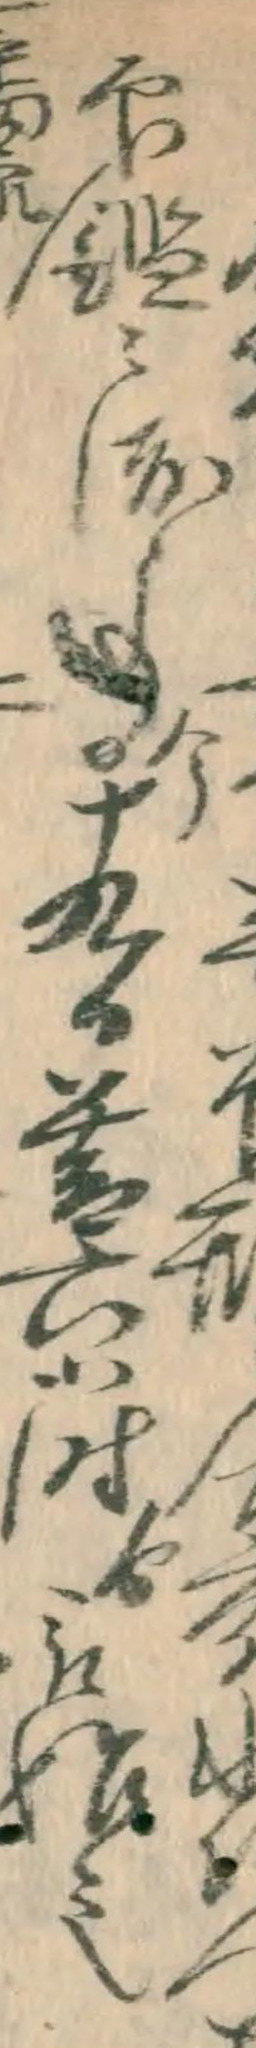印鑑被渡候事今十九日暮六ツ時ゟ被始也
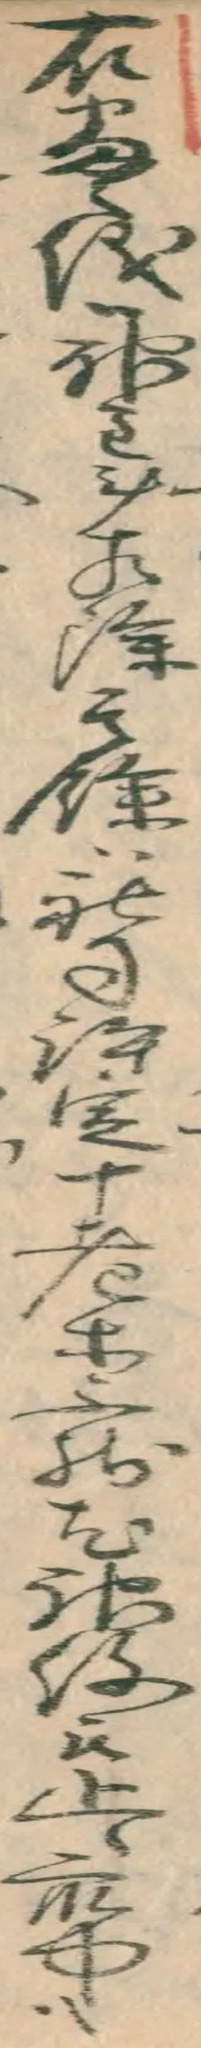右番之儀ハ神主計相除其余ハ社司評定十老等不残尤神役被止候衆中も
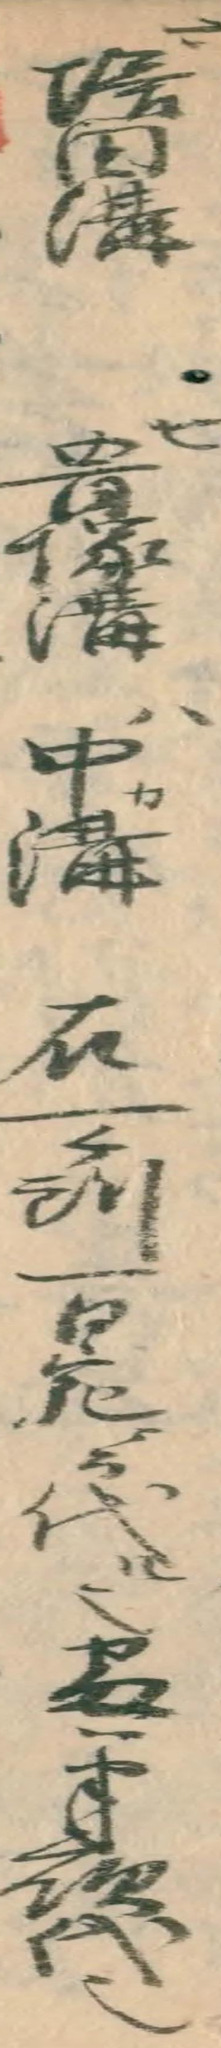六塔田溝七貴塚溝八中か溝右一ケ所一日宛ニ而代ル也番ハ半夜代也
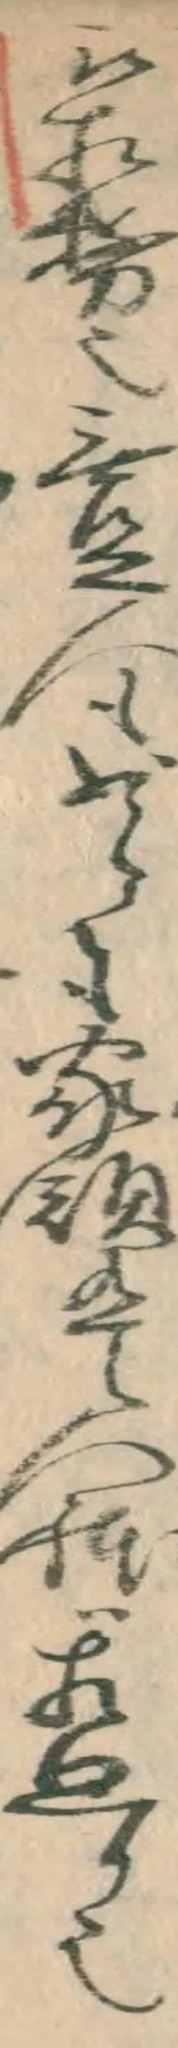被相務也無足人も少々ニても家領有之人体ハ相廻り也
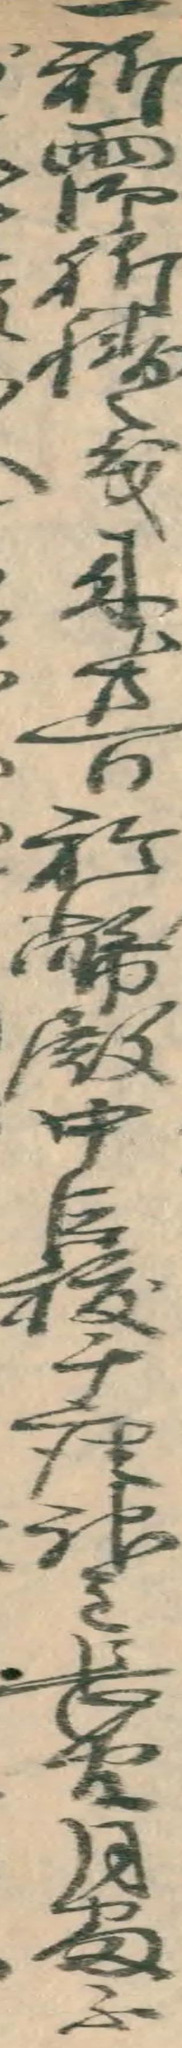一祈雨御祈祷之義来ル廿一日於幣殿中臣祓千座神主長官月番不
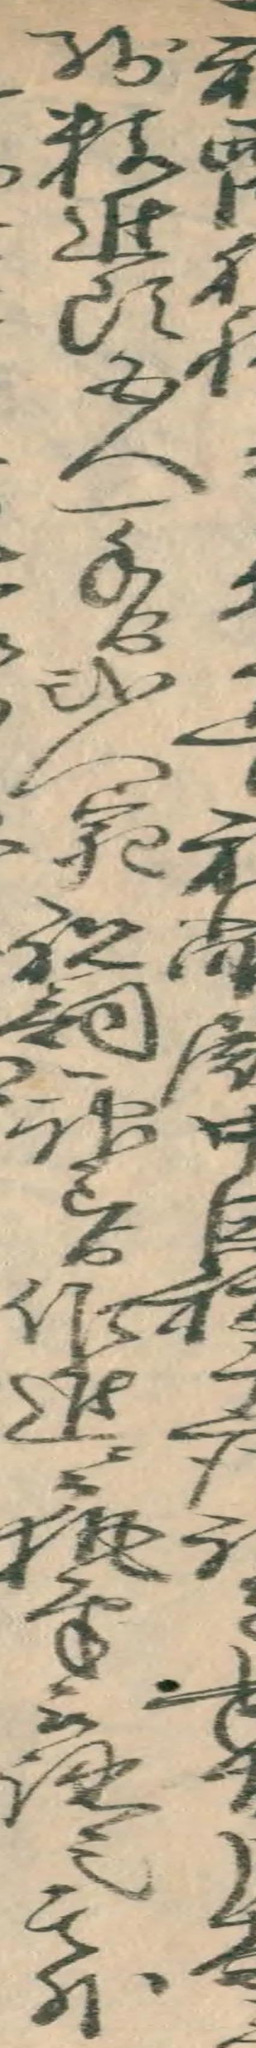残精進頭五人一手ゟ弐人宛祝詞御主ゟ作進ニ而執筆被認也其外
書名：賀茂社記録. 第58冊
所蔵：国立国会図書館 National Diet Library, JAPAN
